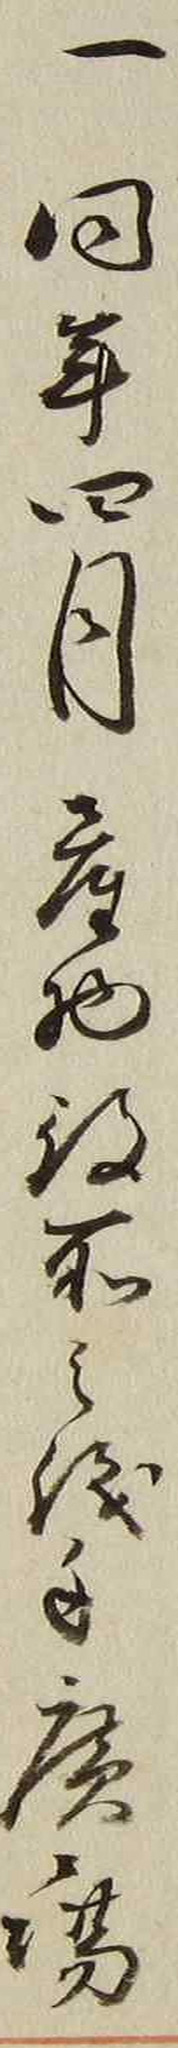一同年四月産物役所之儀手広ニ場
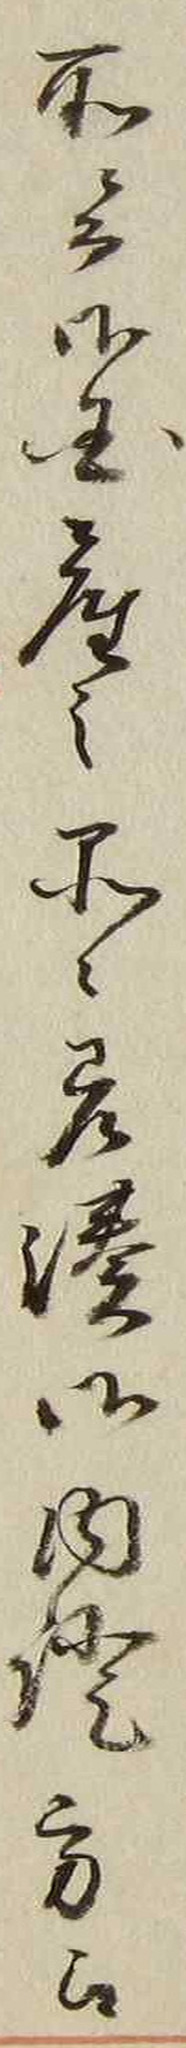所ニ而御国産之品々差売御内證方江
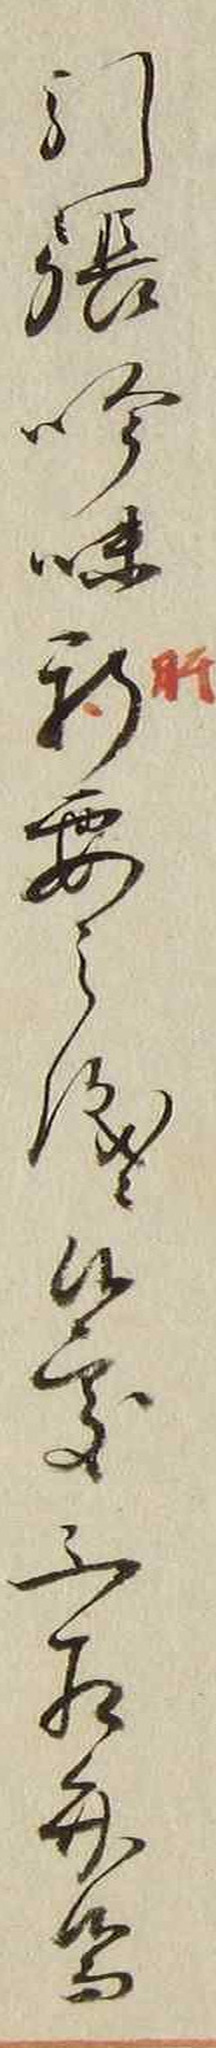引張吟味肝要之儀候処不相弁候而
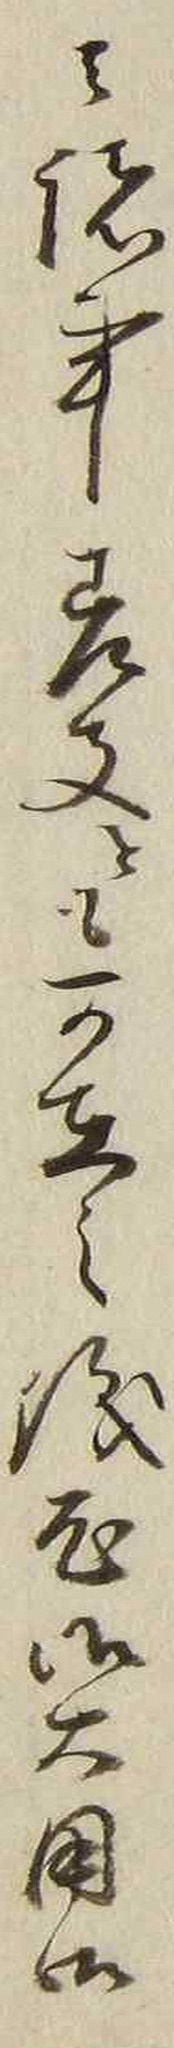者諸事差支ニも可在之儀尤御大用御

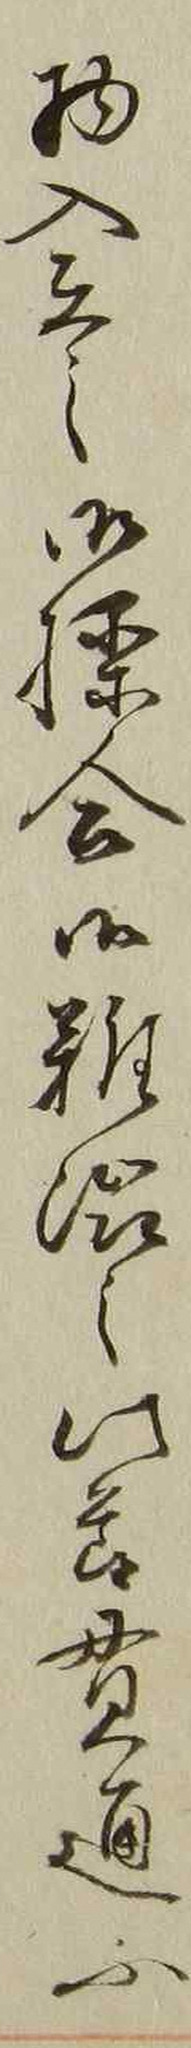物入在之御繰合御難渋之此節貫通不
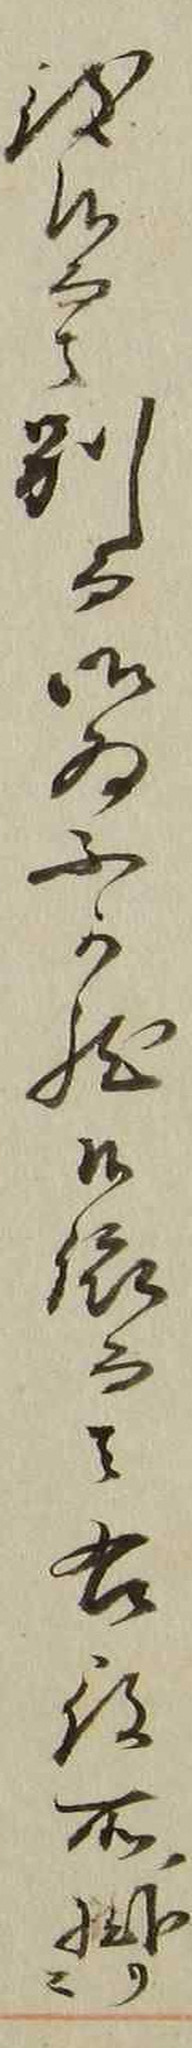致候而者別而御為不可然候依而者右役所ノ掛りニ
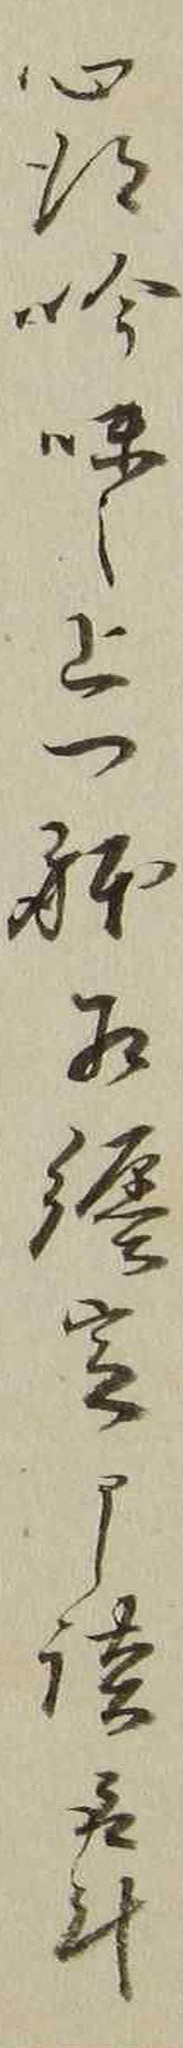心得吟味之上一躰相纏定申談取斗
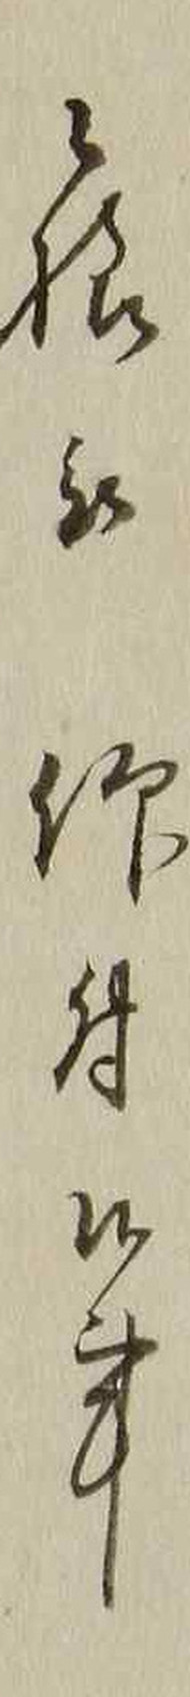候様被仰付候事
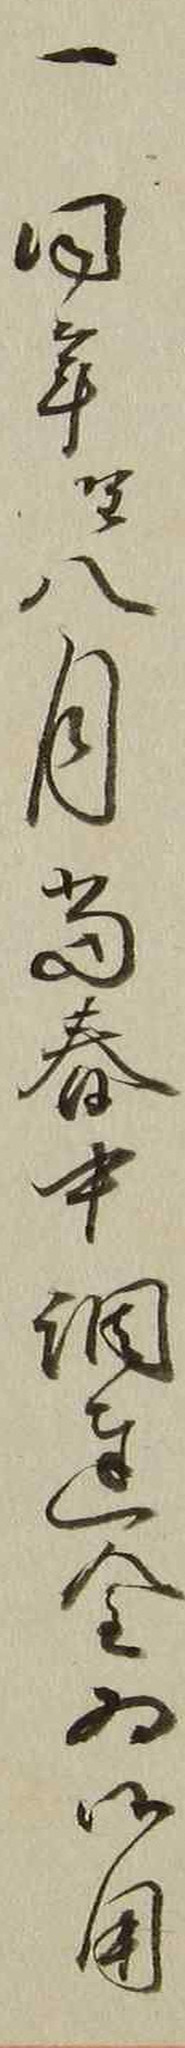一同年閏八月当春中調達金為御用
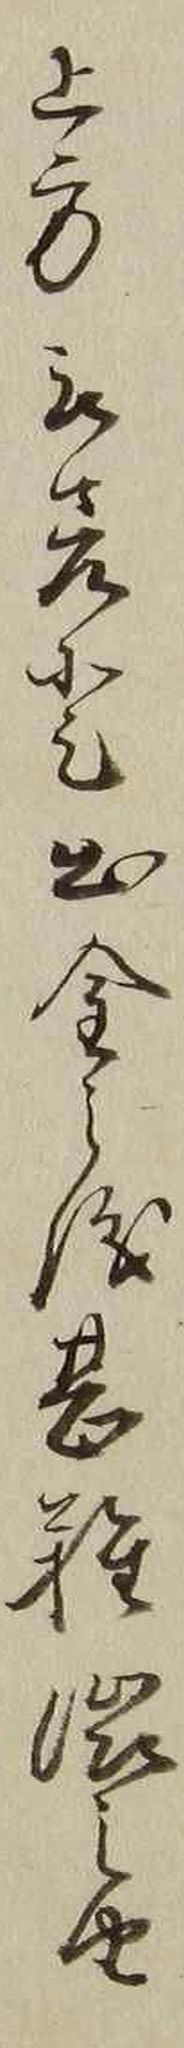上方被差登出金之儀甚難渋之由
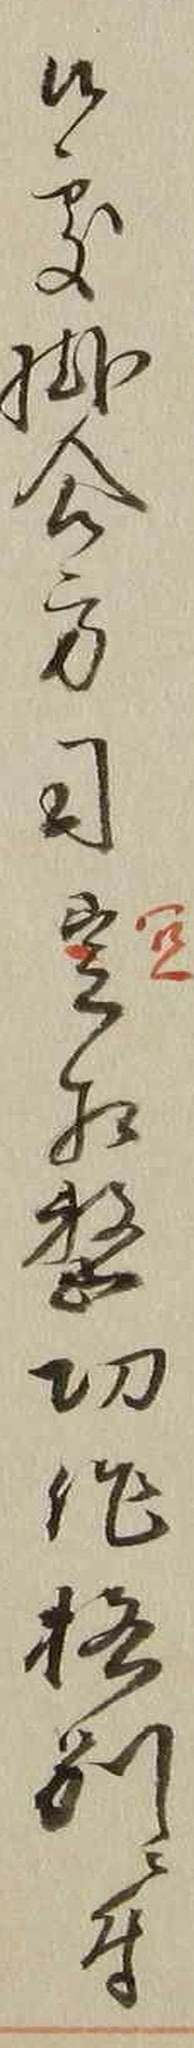候処掛合方用宜相務功作格別ニ付
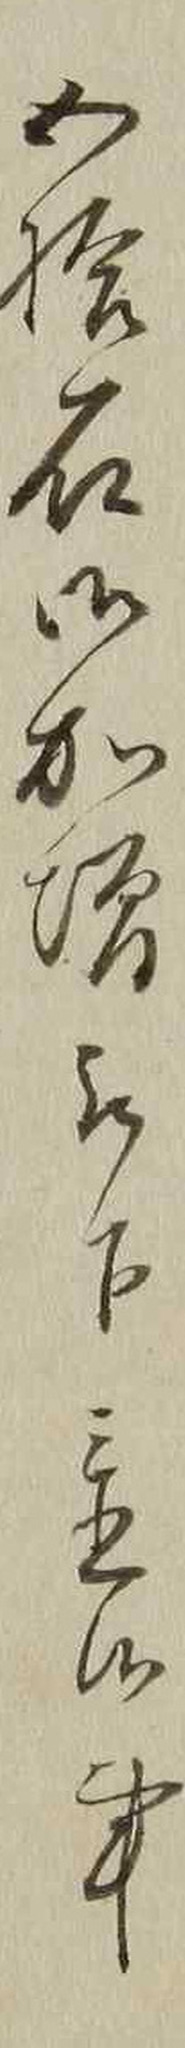五拾石御加増被下置候事
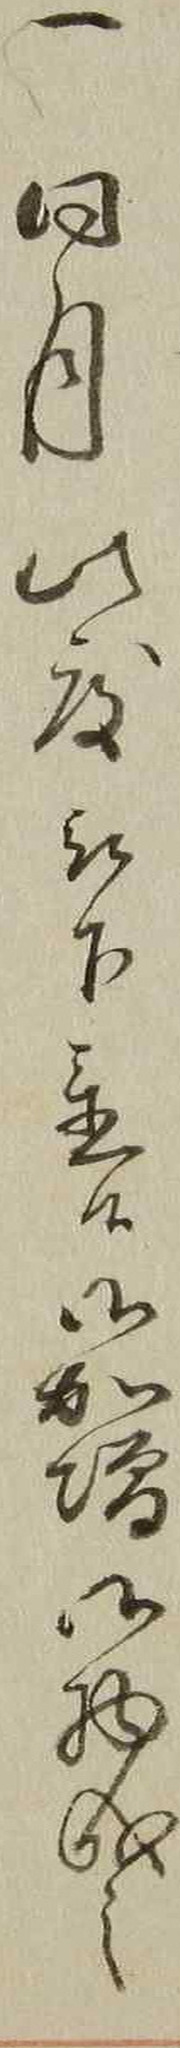一同月此度被下置候御加増御物成之
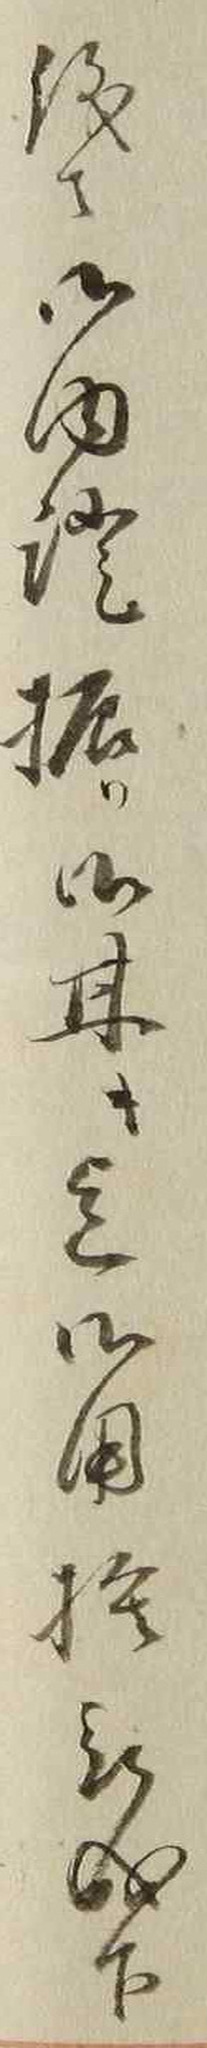儀者御内證振り御甘キ迄御用捨被成下
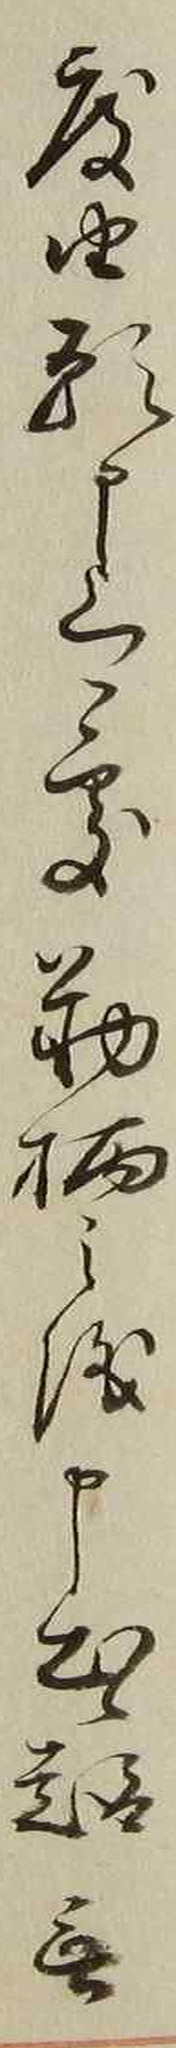度由願申上候処勤柄之儀申出候趣無
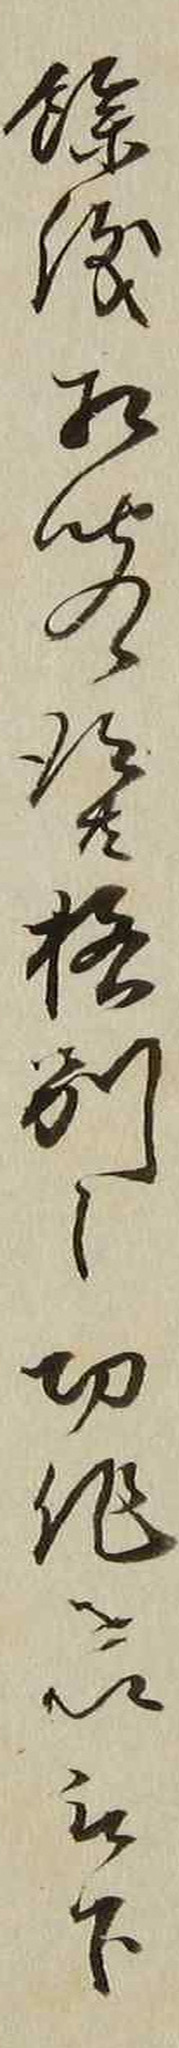余儀相聞候得共格別之功作を以被下
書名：諸士系譜　巻之204　や之部1
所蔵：会津若松市立会津図書館
